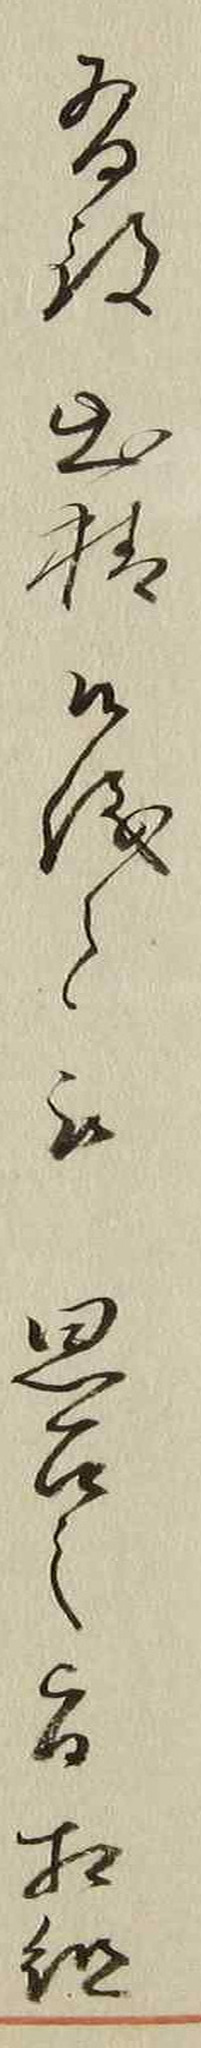習致出精候儀と被思召之旨相組
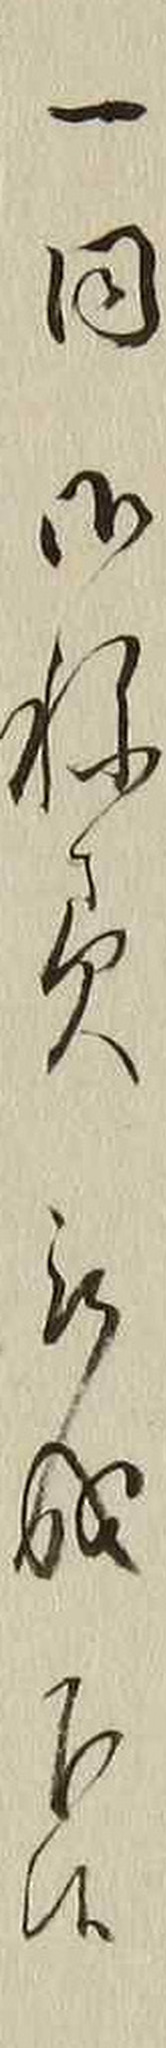一同御称美被成下候
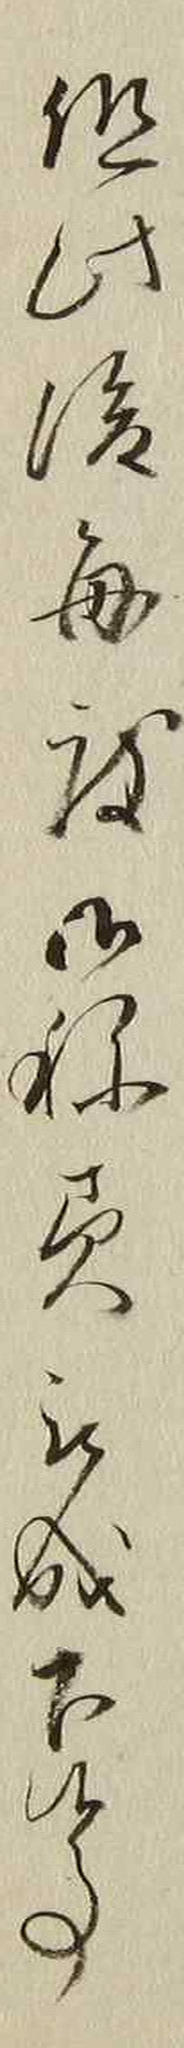但此後毎度御称美被成下候事
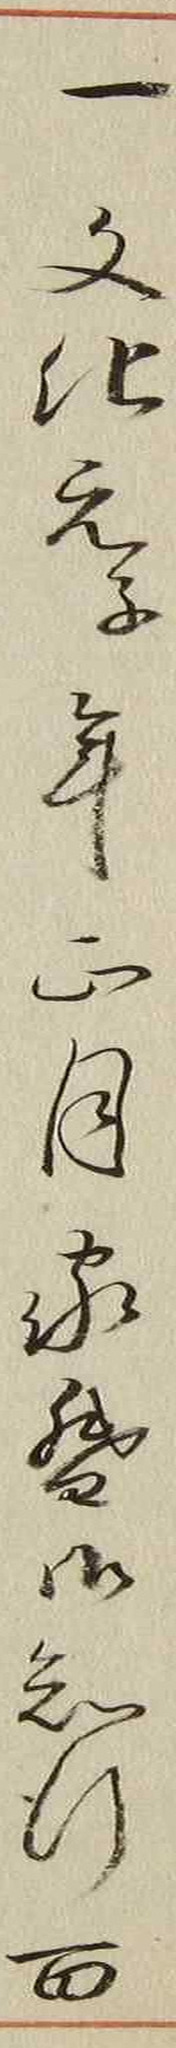一文化元子年正月家督御知行百
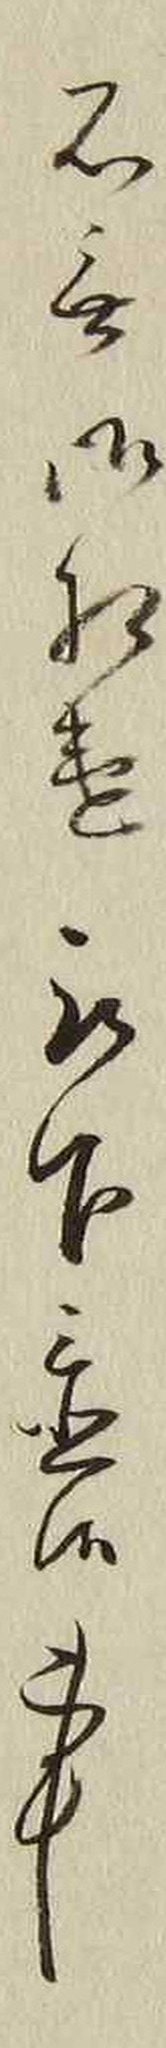石無御相違被下置候事
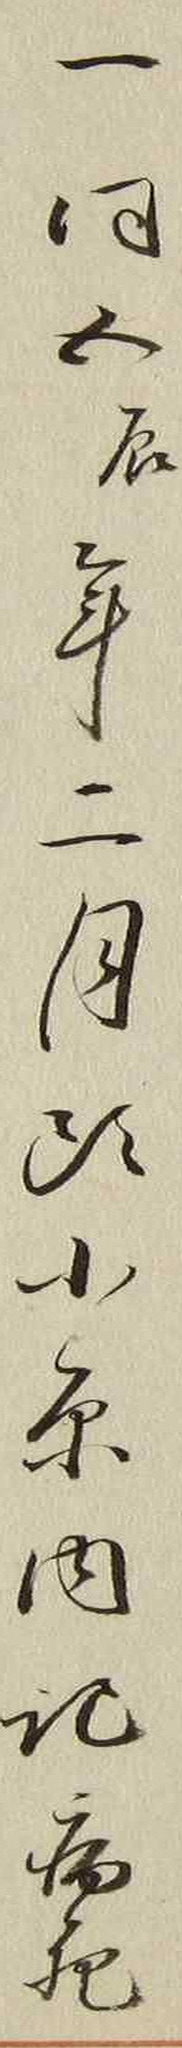一同五辰年二月頭小原内記病死
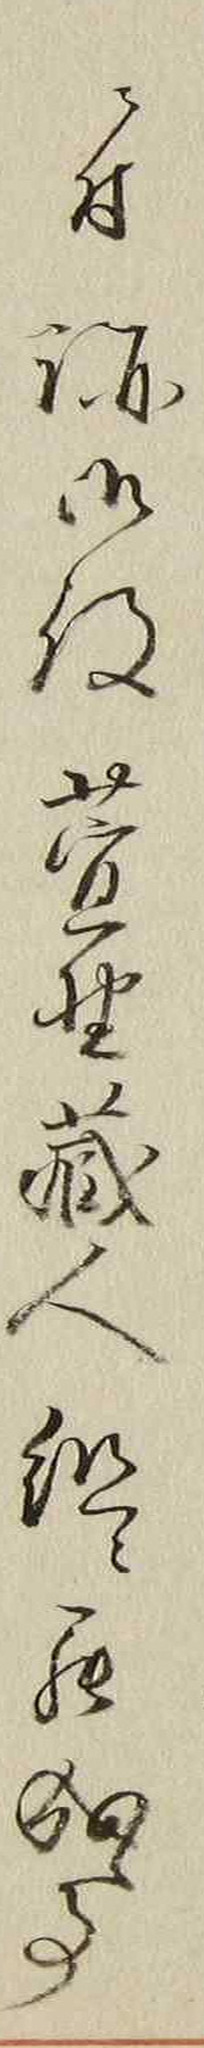ニ付跡御役萱野蔵人組ニ罷成候事
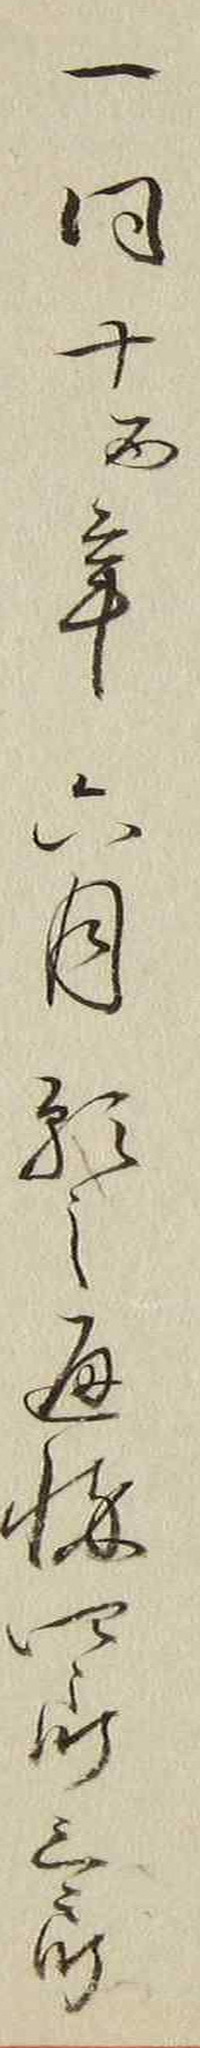一同十酉年六月願之通悴四郎三郎
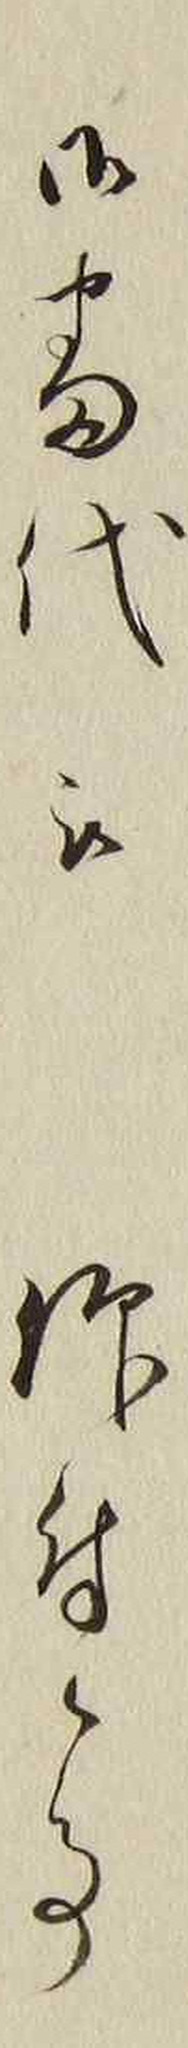御番代被仰付候事
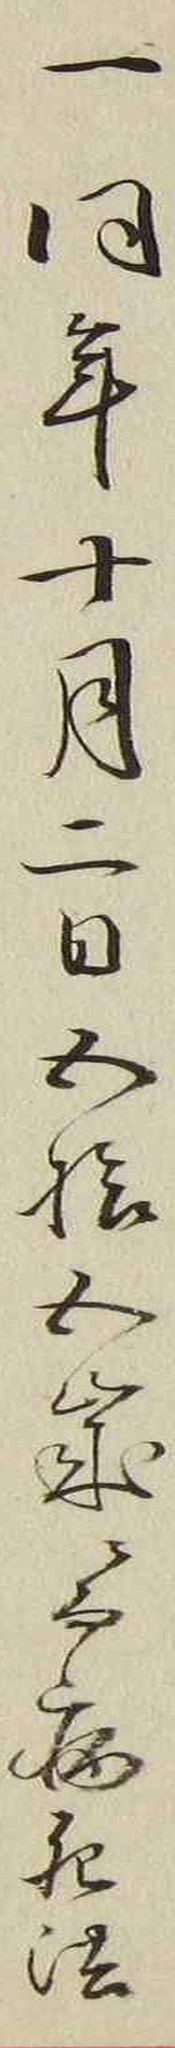一同年十月二日五拾五歳ニ而病死法

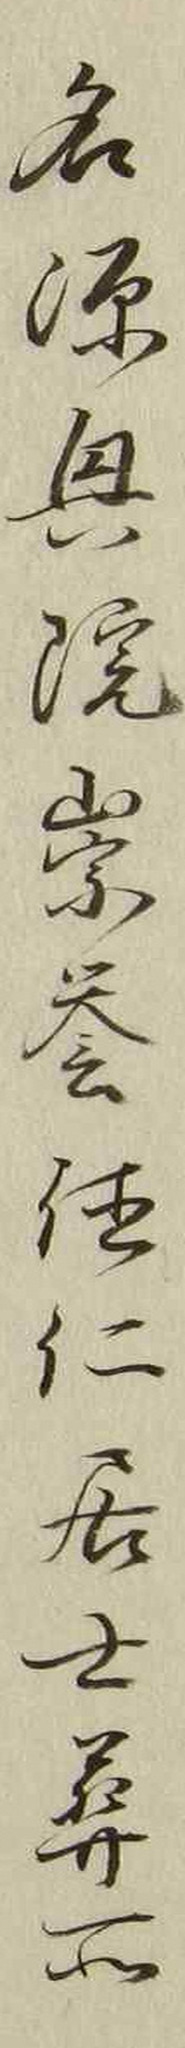名源興院崇誉徳仁居士葬所
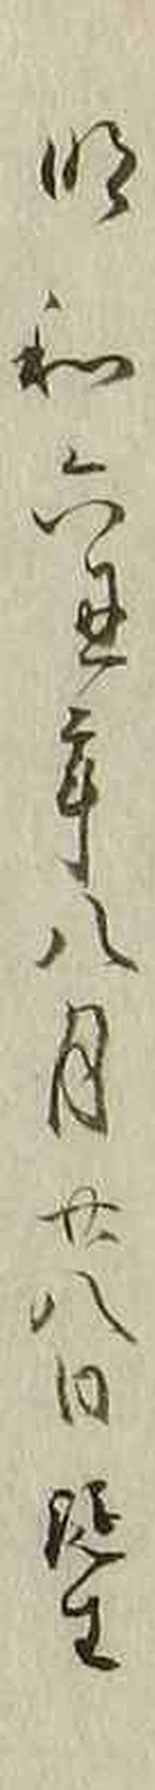明和六丑年八月廿八日誕生
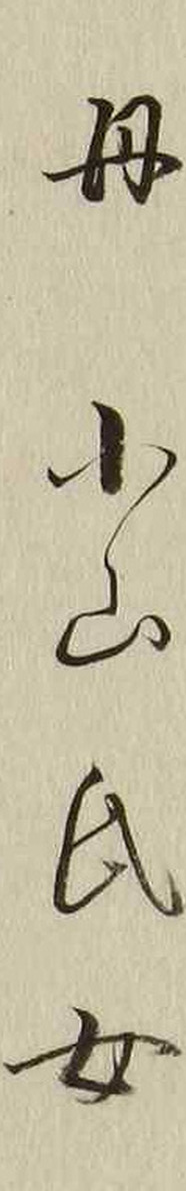母小山氏女
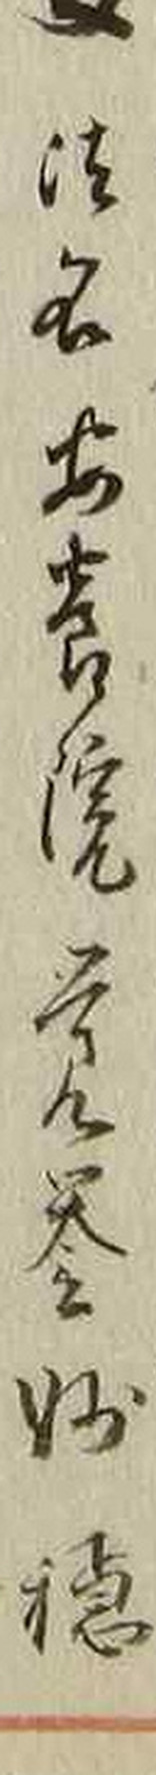法名安養院覚誉妙穂
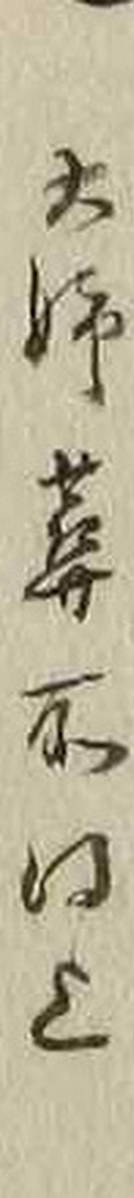大姉葬所同上
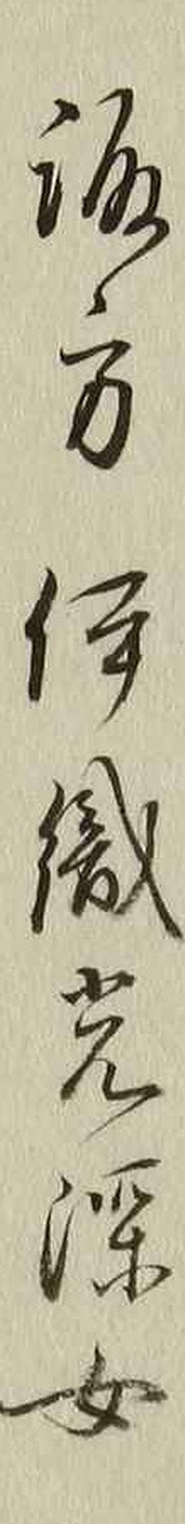諏方伊織光深女
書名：諸士系譜　巻之28　い之部28
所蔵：会津若松市立会津図書館
